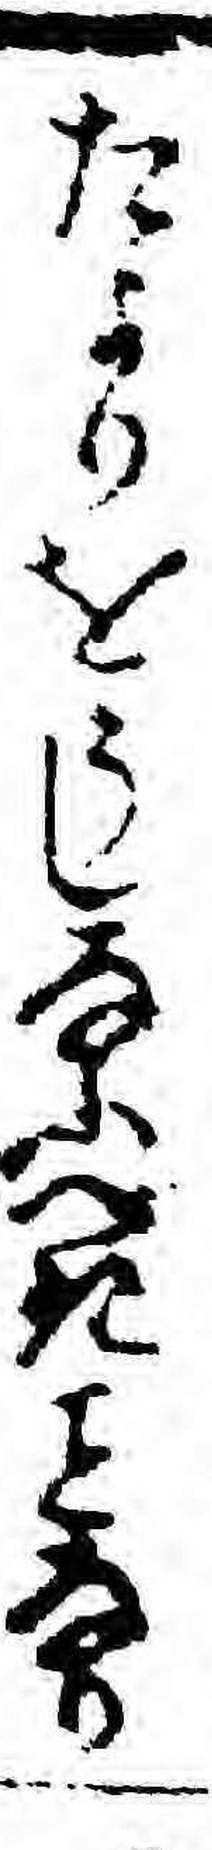たよりをうしなふへきことなり
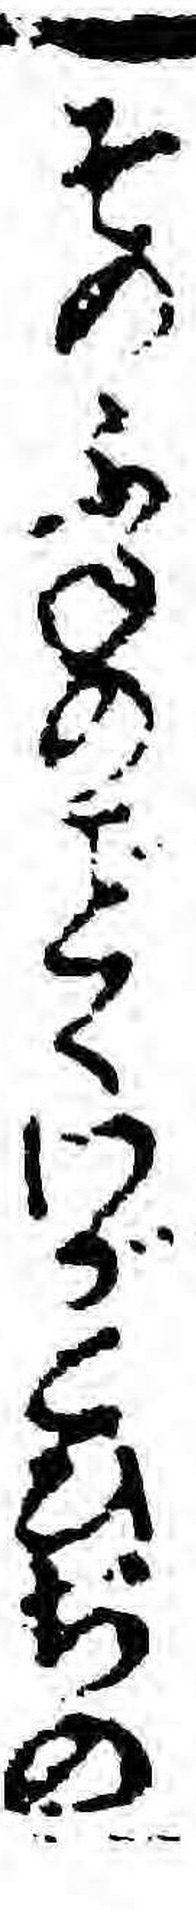そのふねのごとくわがこひぢの
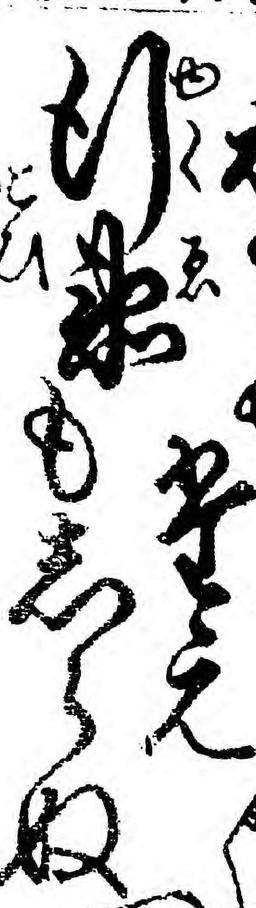行衛もしらぬ
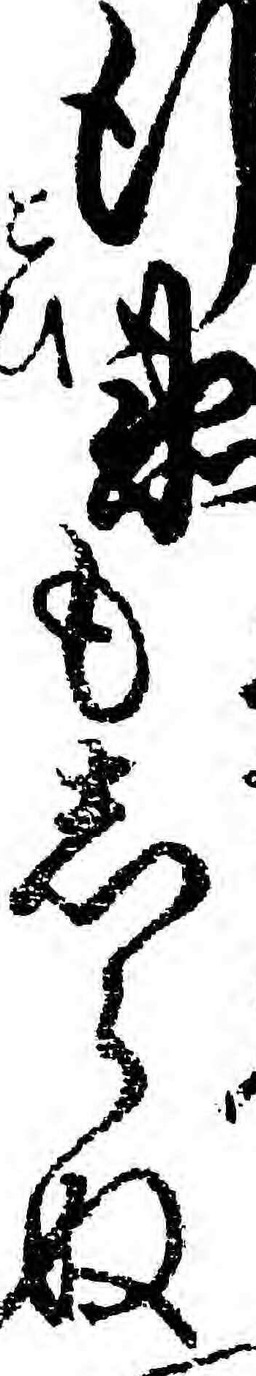行衛もしらぬ
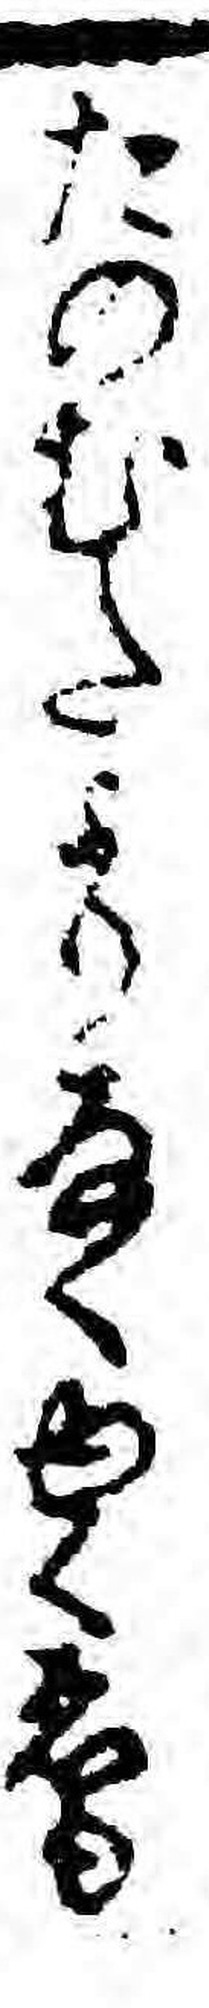たのむたよりなくゆくゑも
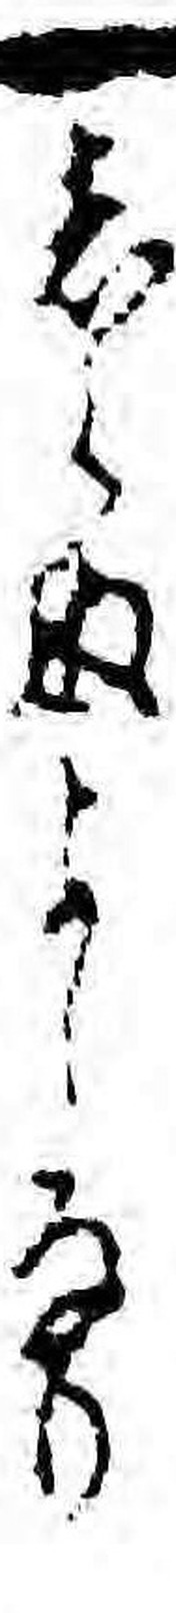しらぬよしなり
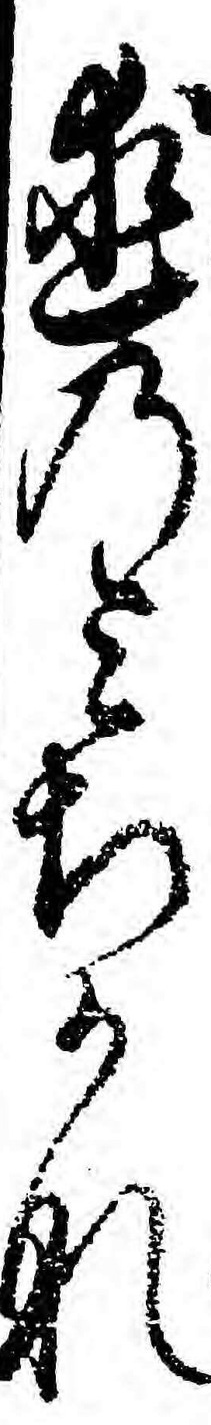恋のみちかな
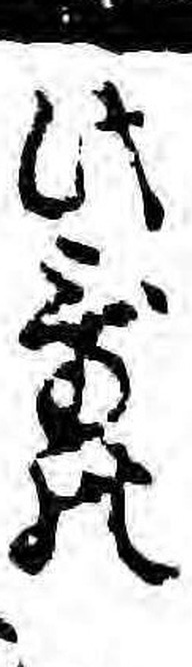此哥の
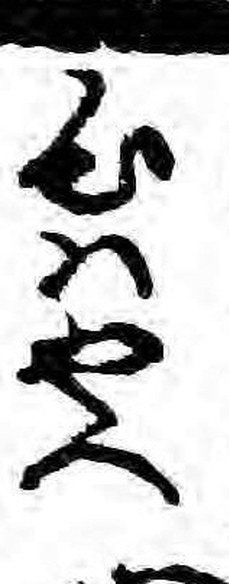心はやへ
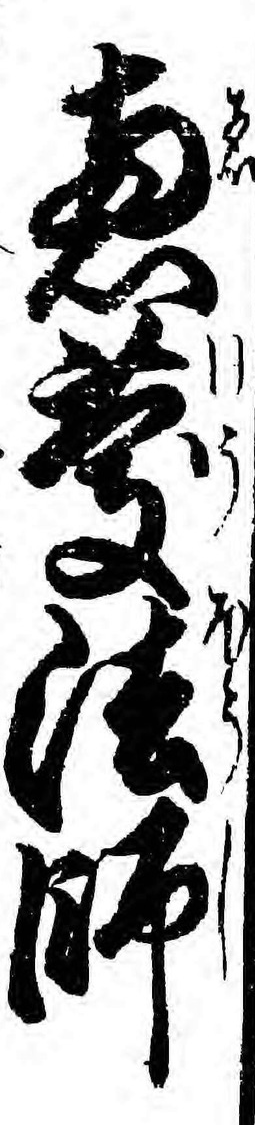惠慶法師
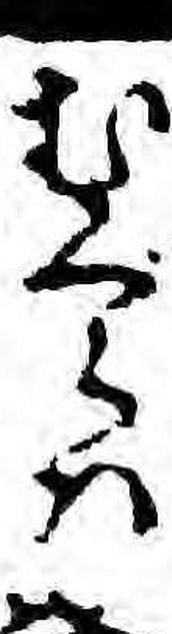むぐらは
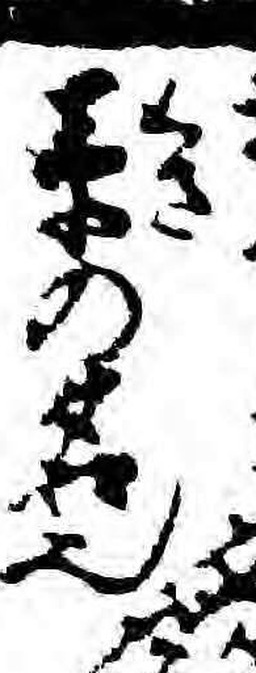草の名也
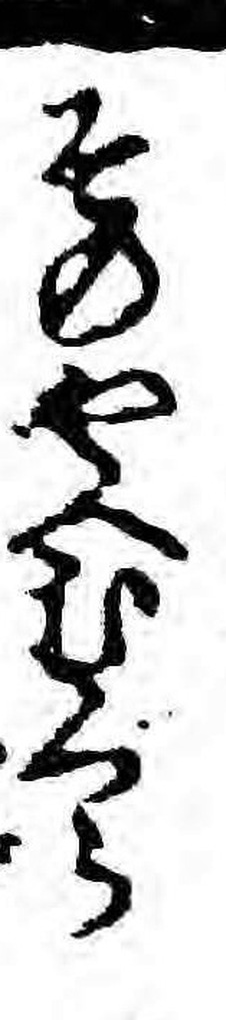そのやへむぐら
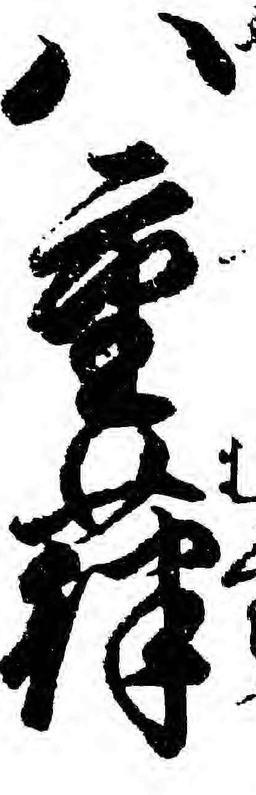八重葎
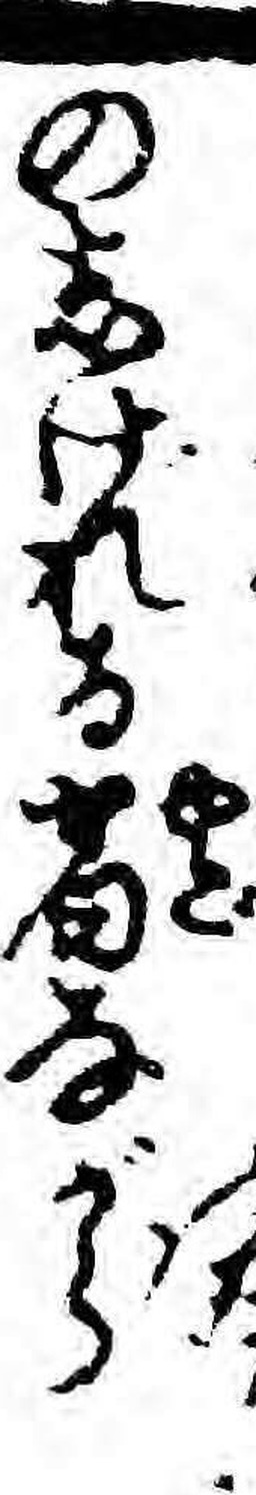のしげれる宿ながら
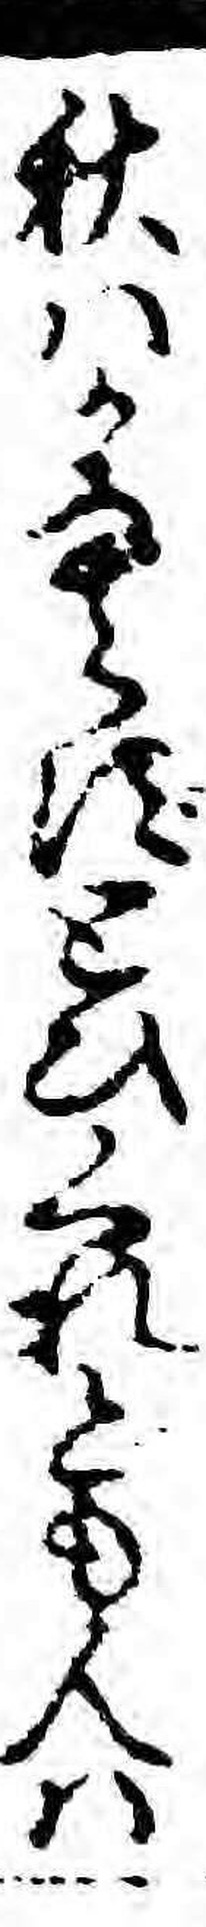秋はかならずとひくれども人は
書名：頭書和歌注譯／壽賀多百人一首小倉錦
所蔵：国文学研究資料館
